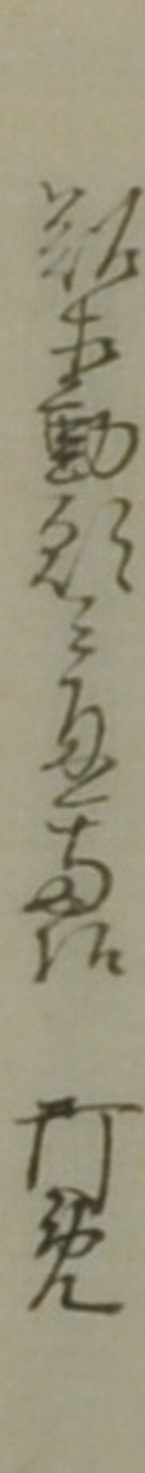難相勤願之通両役御免
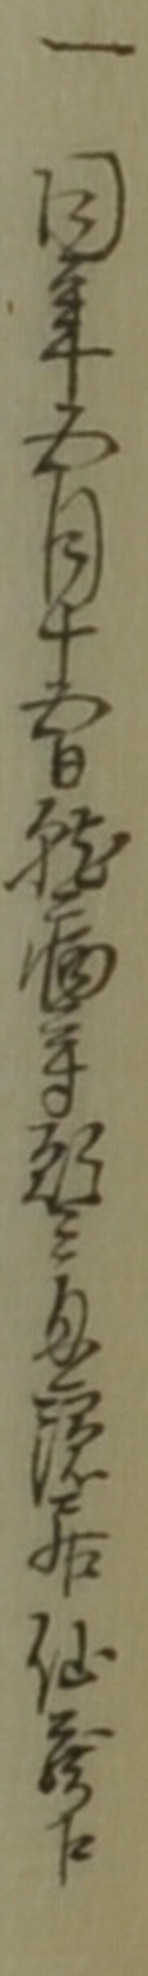一同年五月十五日就病気願之通隠居仙蔵江
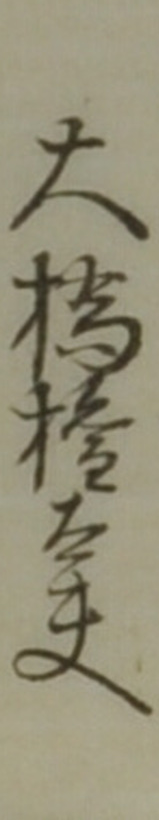大橋権太夫

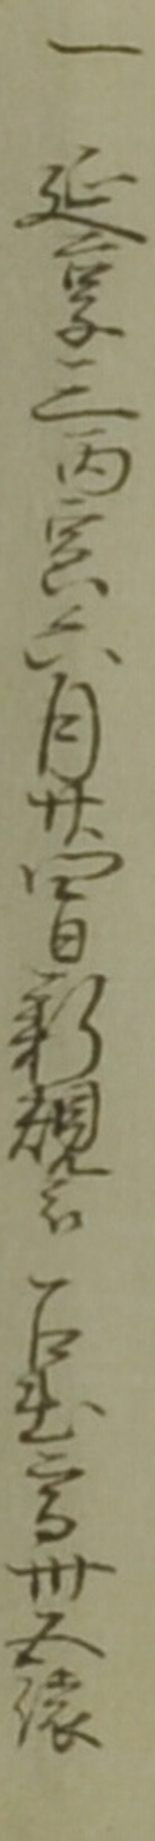一延享三丙寅六月廿四日新規被召出高卅五俵
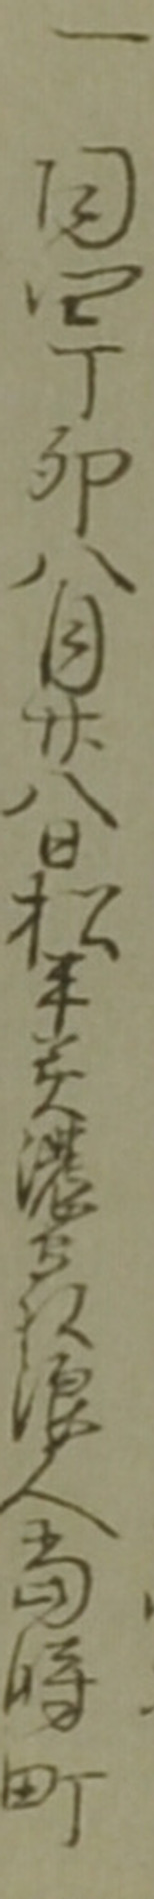一同四丁卯八月廿八日松平美濃守様浪人当時町
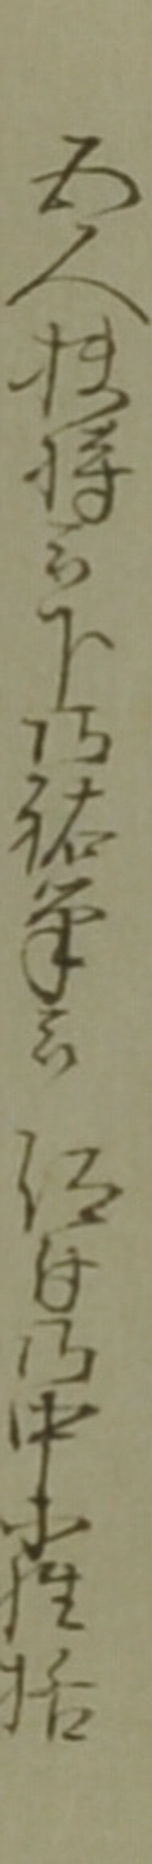五人扶持被下御祐筆被仰付御中小性格
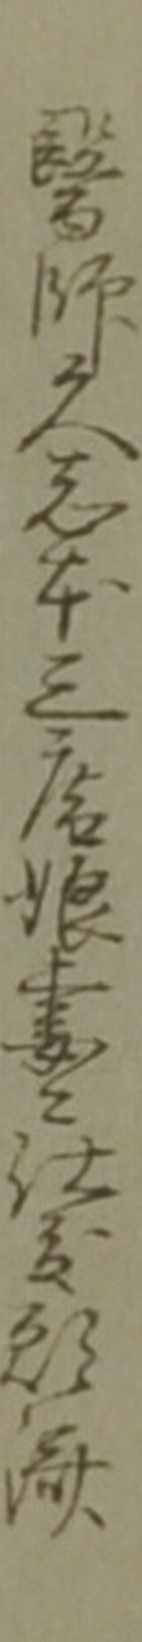医師久志本三庵娘妻仕度願済
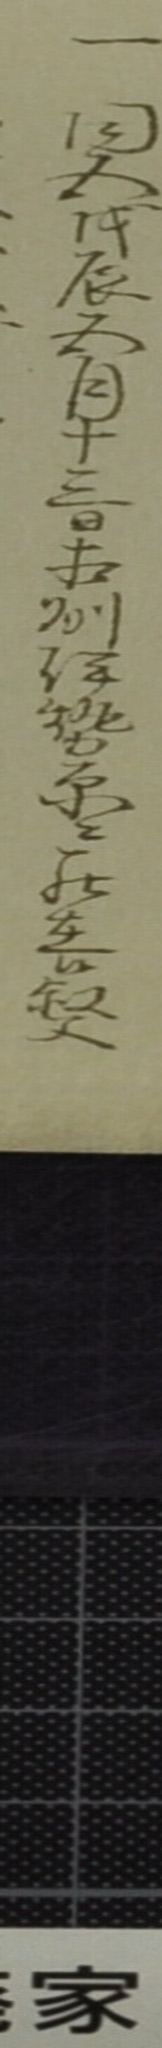一同五戊辰五月十三日相州伊勢原罷在候叔父
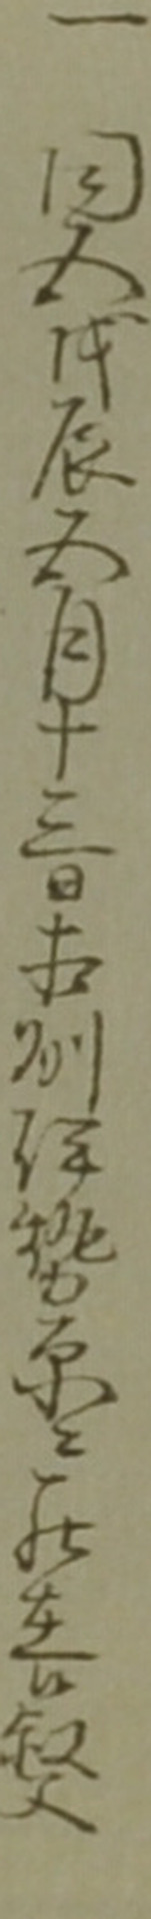一同五戊辰五月十三日相州伊勢原罷在候叔父
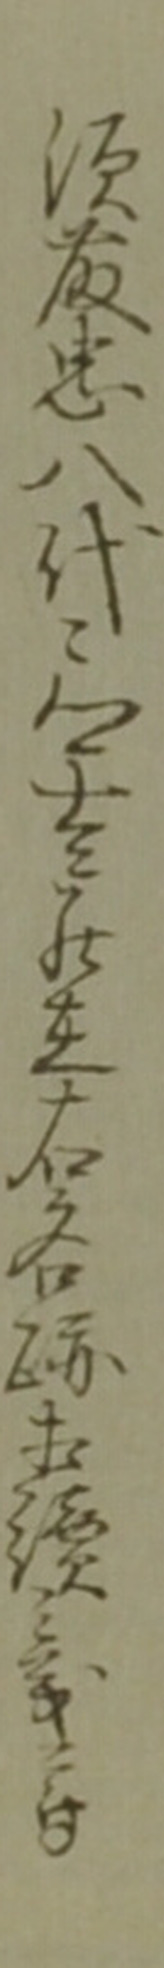源藤忠八代々郷士罷在右名跡相続之義ニ付
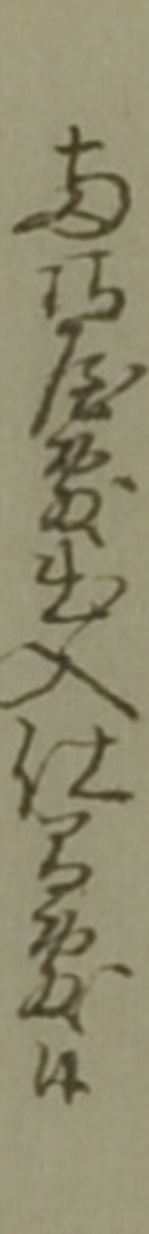両御屋敷出入仕間敷候
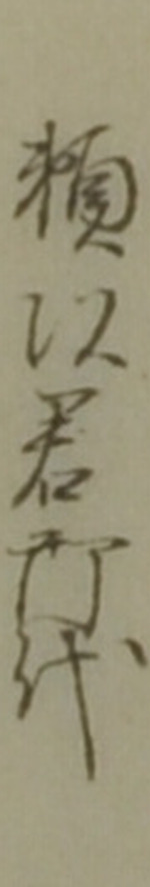頼以君御代
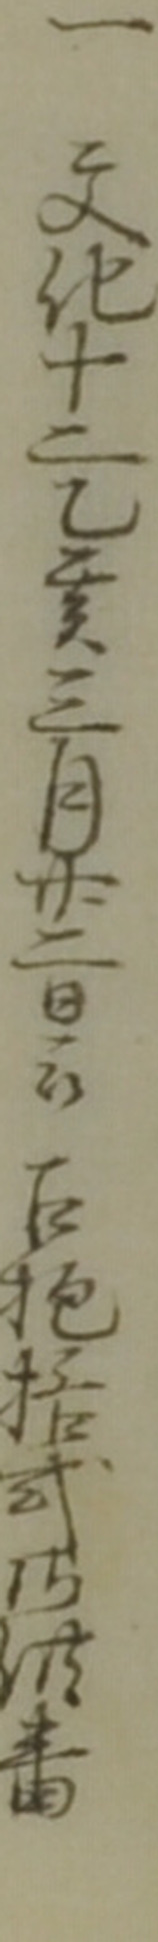一文化十二乙亥三月廿ニ日被召抱格式御供番
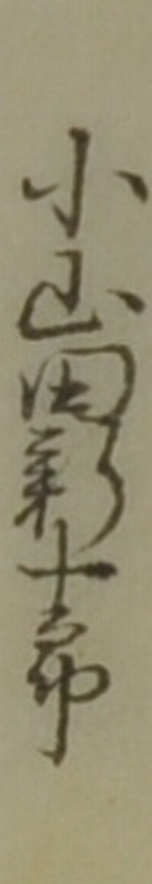小山田新十郎
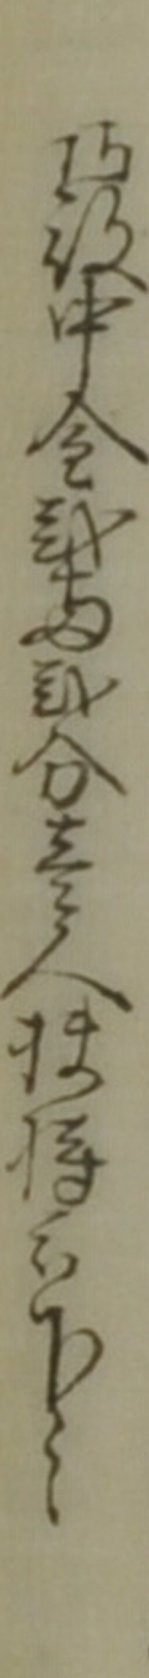御役中金弐両弐分壱人扶持被下之
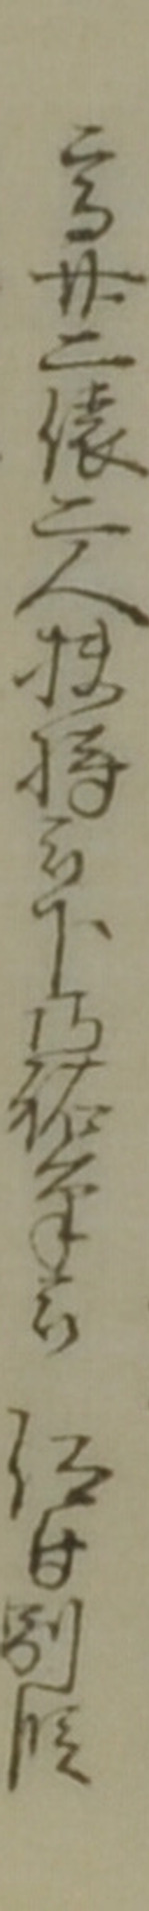高廿二俵二人扶持被下御祐筆被仰付別段
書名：無足廃家（弐）
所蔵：伊那市立高遠町図書館・合同会社AMANE
